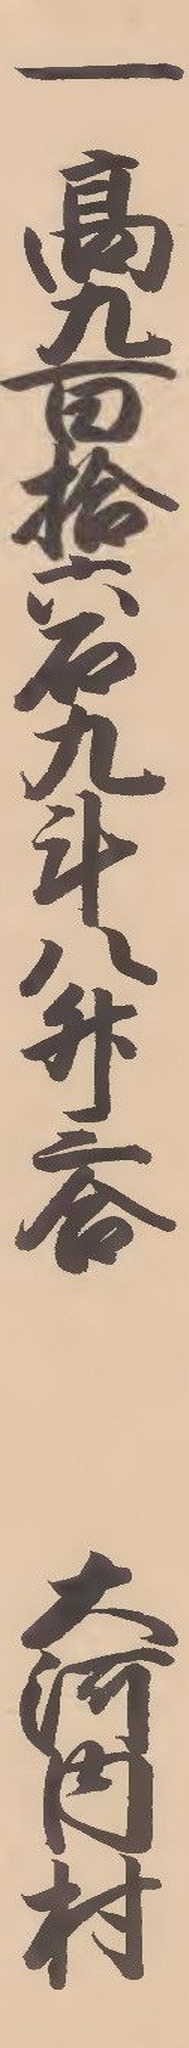一髙九百拾六石九斗八升三合大河内村
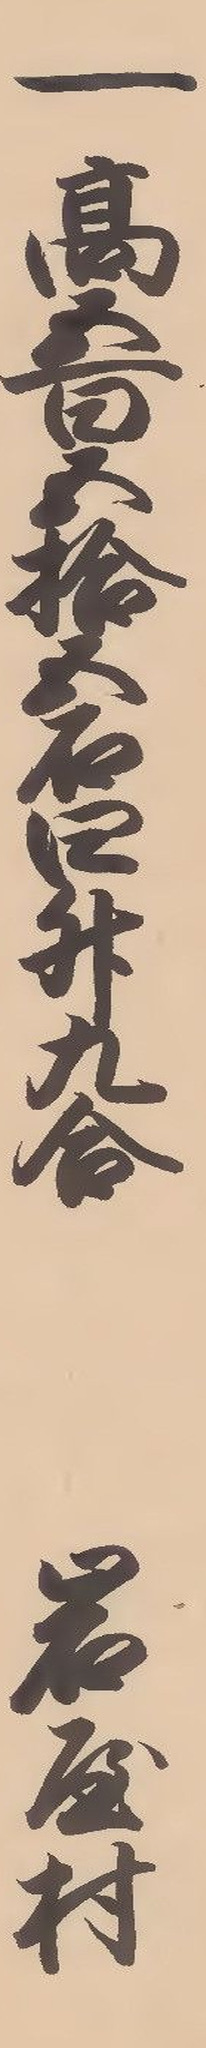一髙五百五拾五石四升九合岩屋村
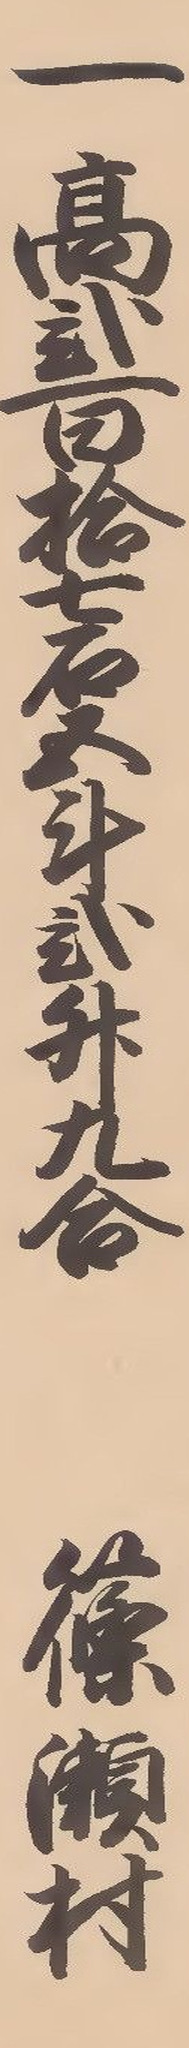一髙弐百拾七石五斗弐升九合篠瀬村
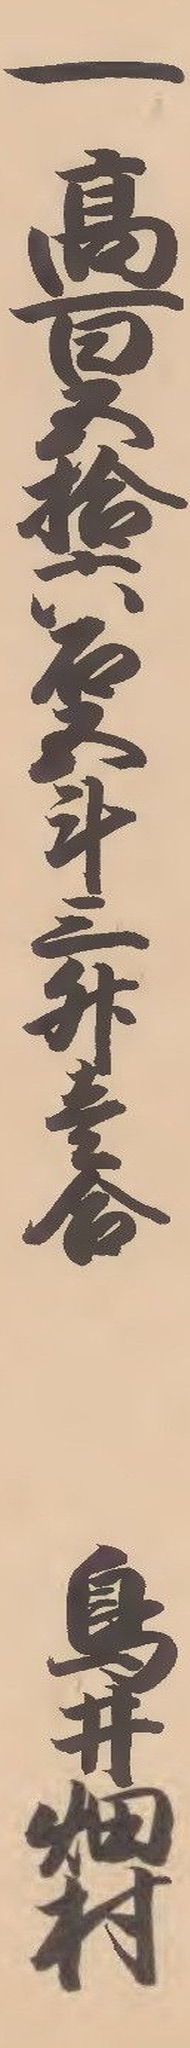一高百五拾六石五斗三升壱合鳥井畑村
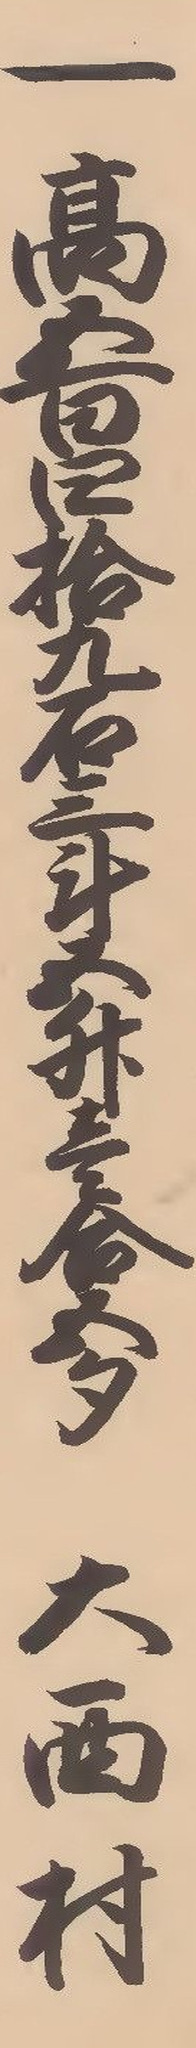一髙五百四拾九石三斗五升壱合五夕大西村
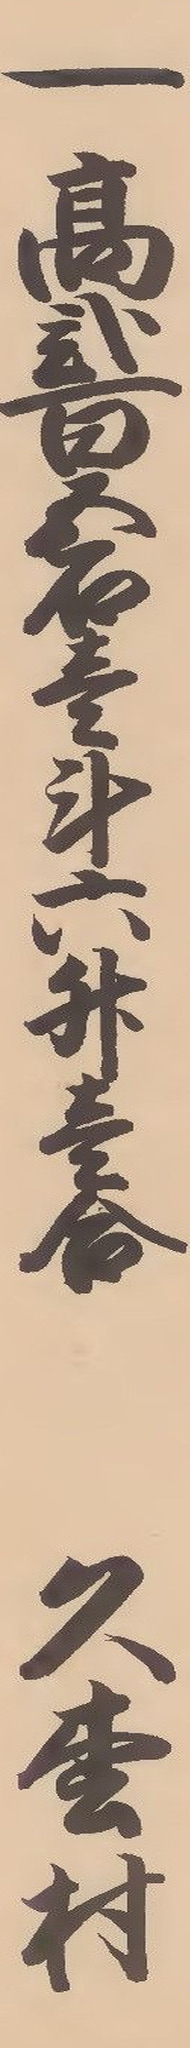一髙弐百五石壱斗六升壱合久松村
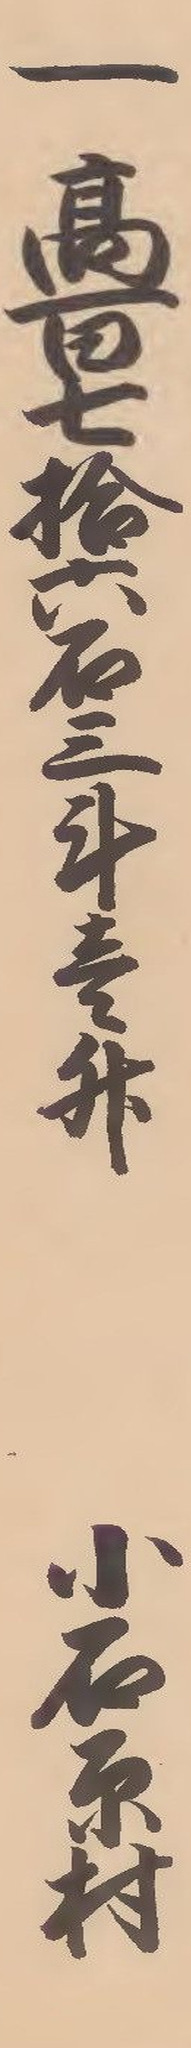一高百七拾六石三斗壱升小石原村

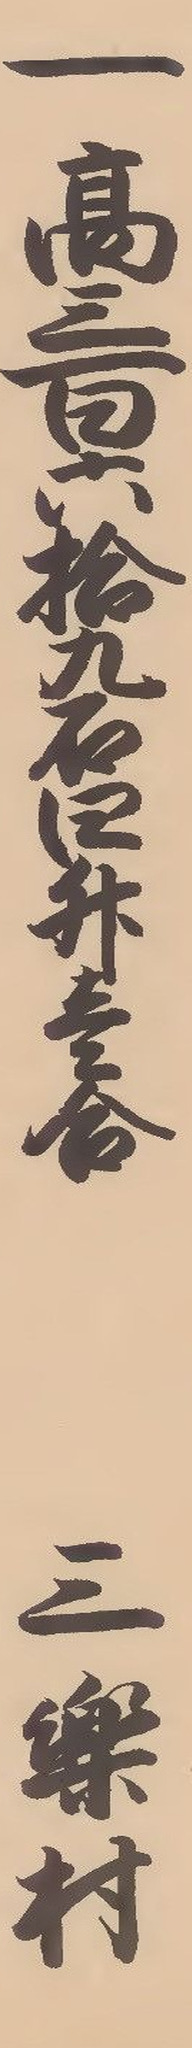一髙三百六拾九石四升壱合三樂村
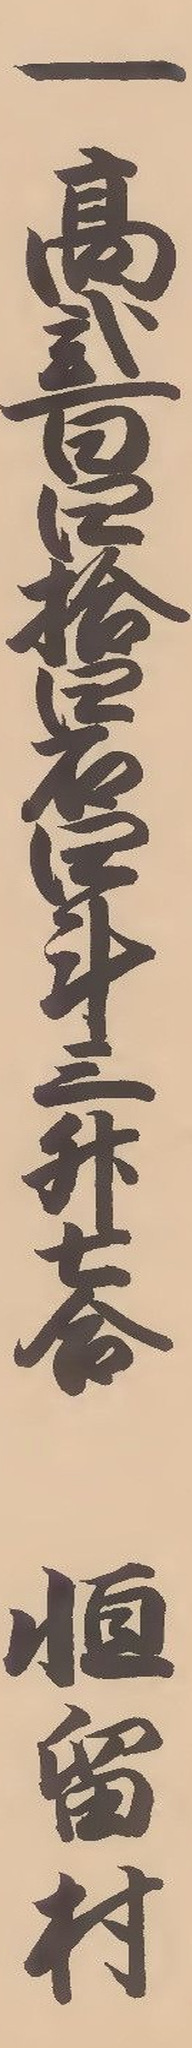一髙弐百四拾四石四斗三升七合恒留村
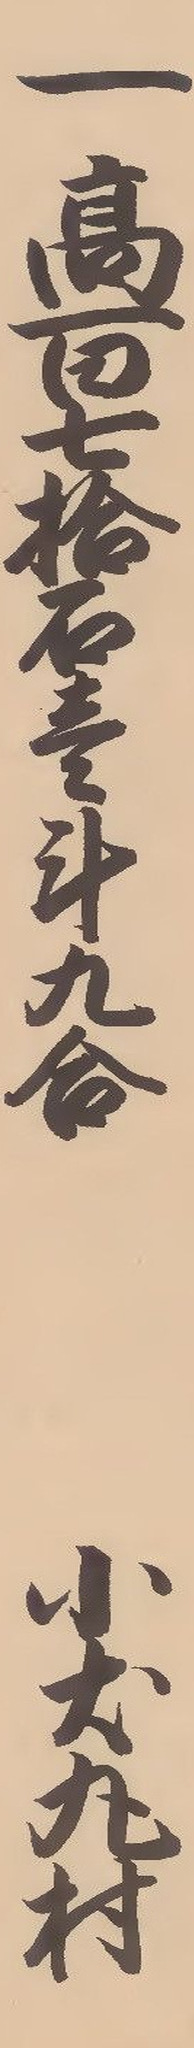一高百七拾石壱斗九合小犬丸村
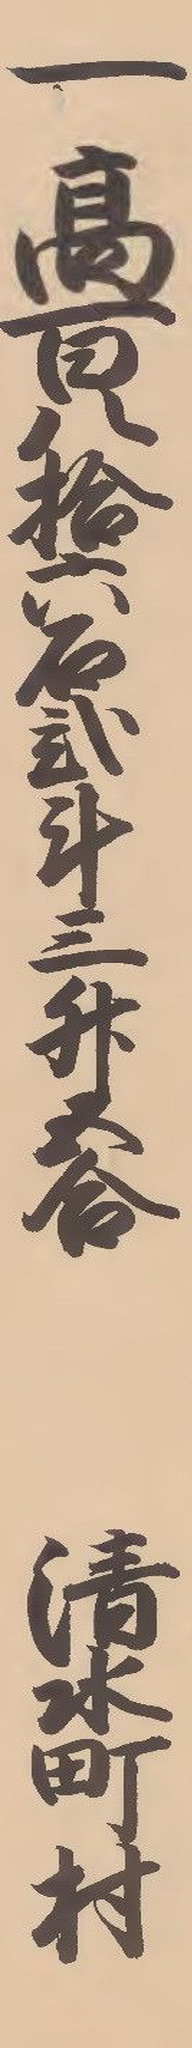一髙百八拾六石弐斗三升五合清水町村
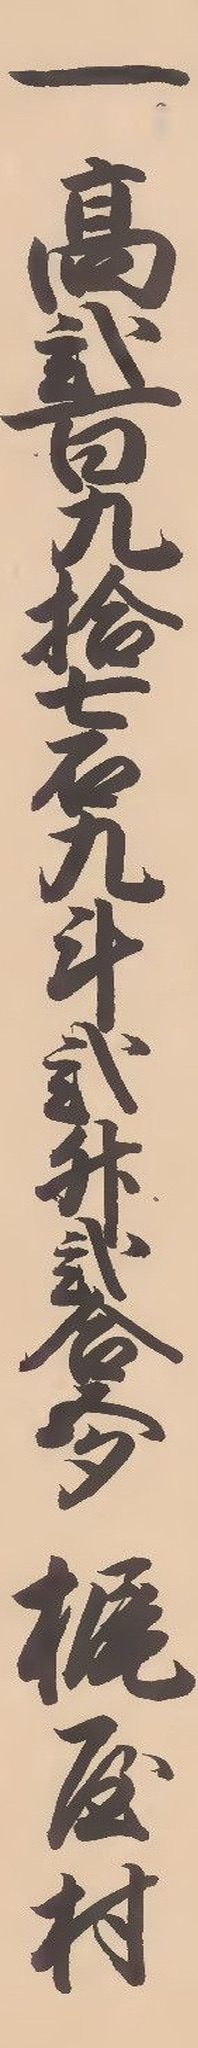一髙弐百九拾七石九斗弐升弐合五夕梶屋村
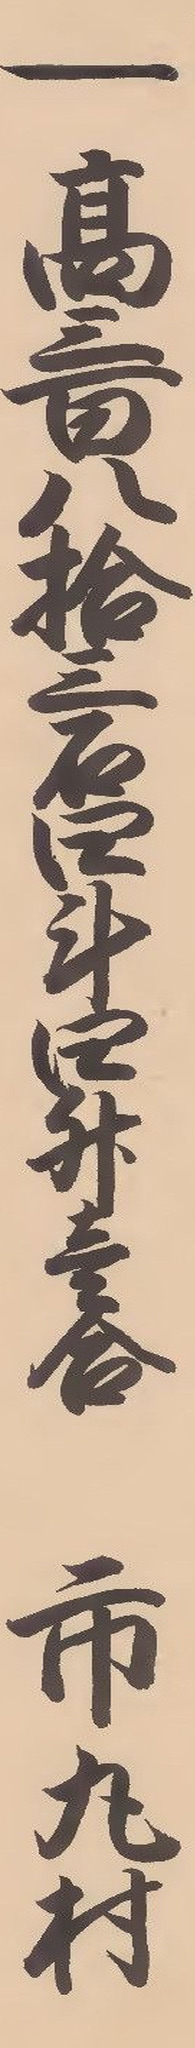一髙三百八拾三石四斗四升壱合市丸村
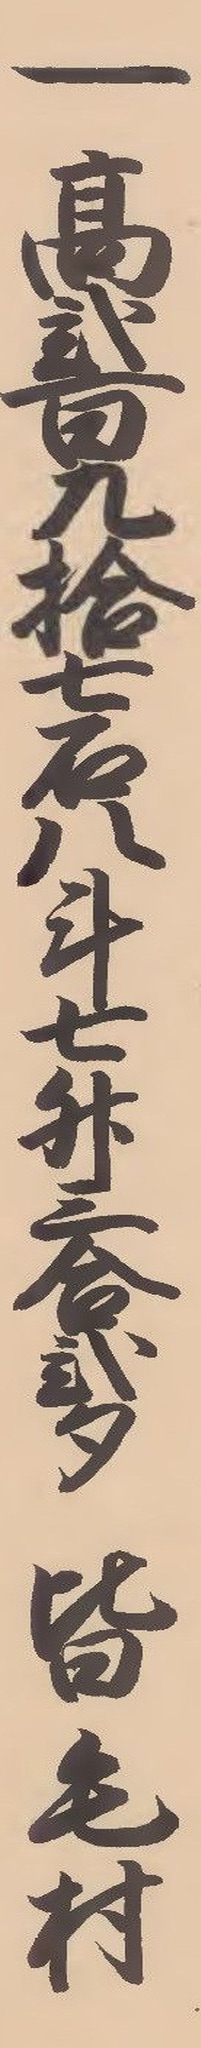一髙弐百九拾七石八斗七升三合弐夕皆毛村
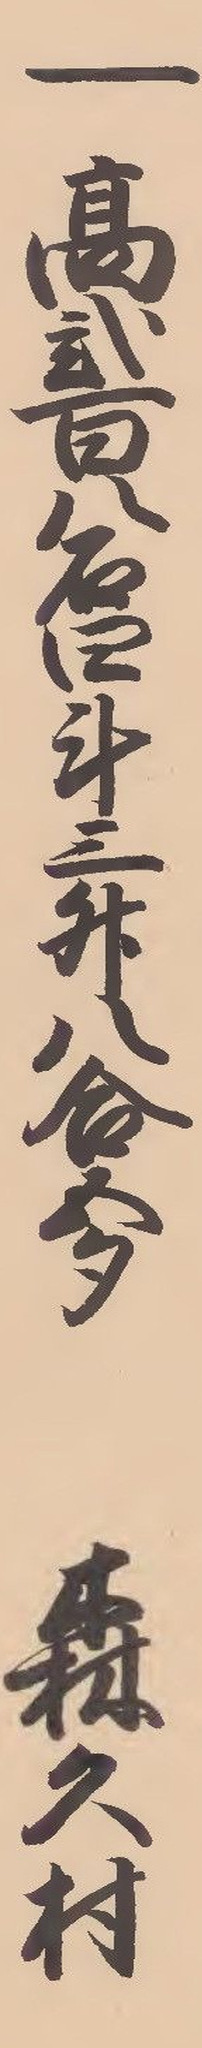一髙弐百八石四斗三升八合五夕森久村

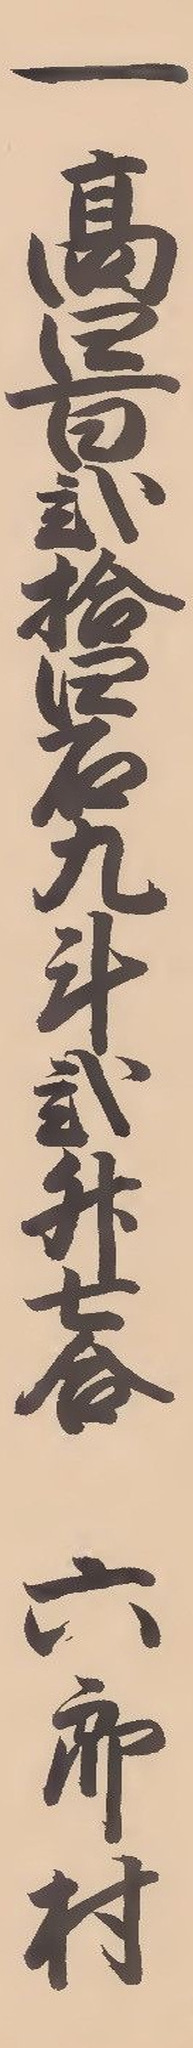一髙四百弐拾四石九斗弐升七合六郎村
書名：豊前国郷帳
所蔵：国立公文書館 National Archives of Japan
